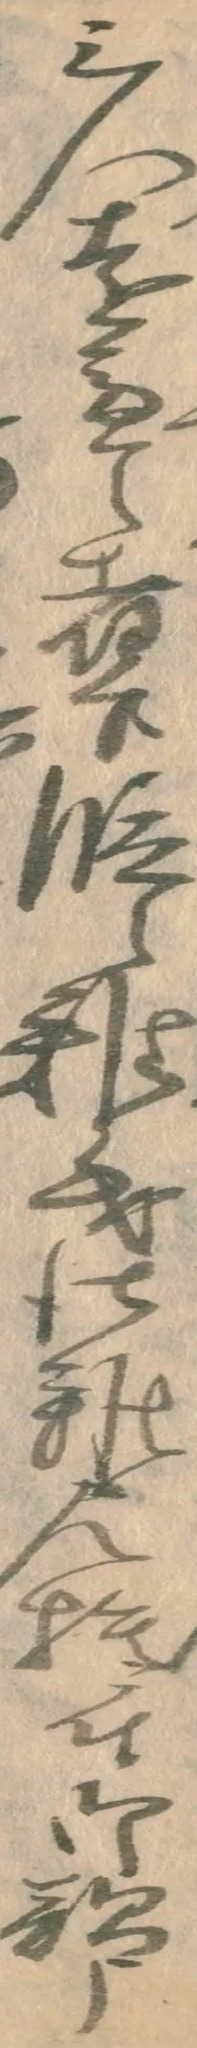三人遠慮之者下段之難義仕難見捨ニ付御歎申
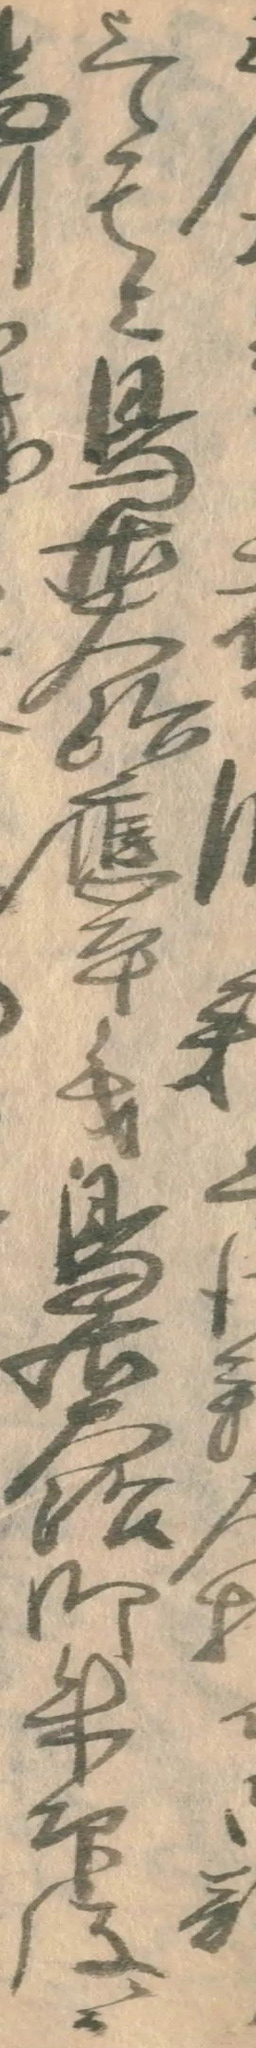上候其上鳥居大路応平之義鳥居大路御朱印役ニ而
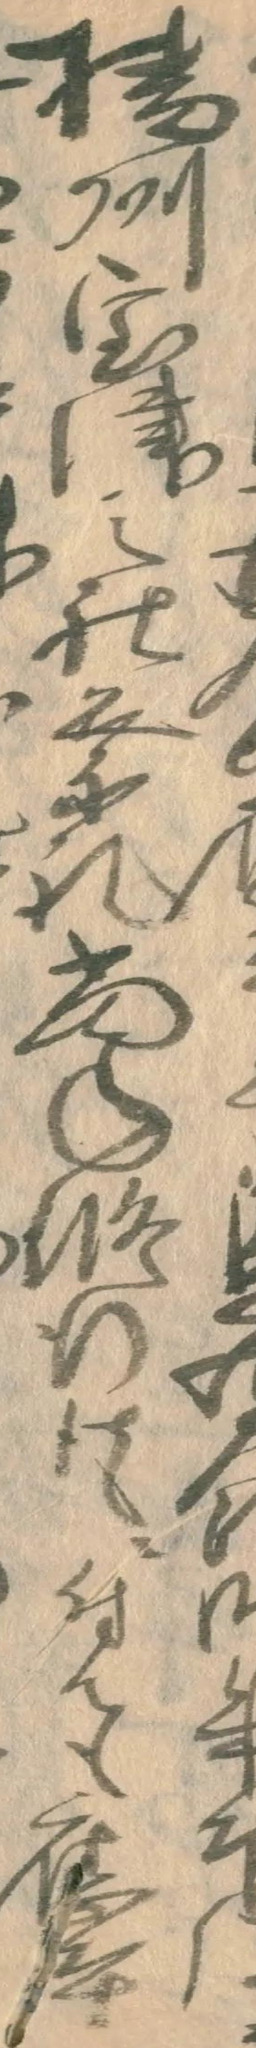播州宝津之社祭礼当年修行仕候ニ付ても応平
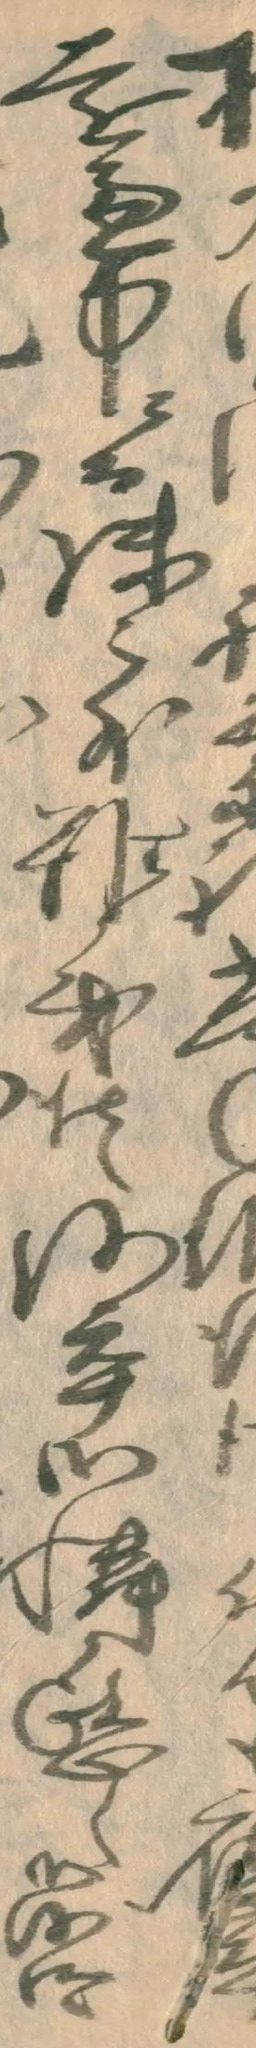遠慮中ニ而殊之外難義仕候何卒御憐愍之御沙汰
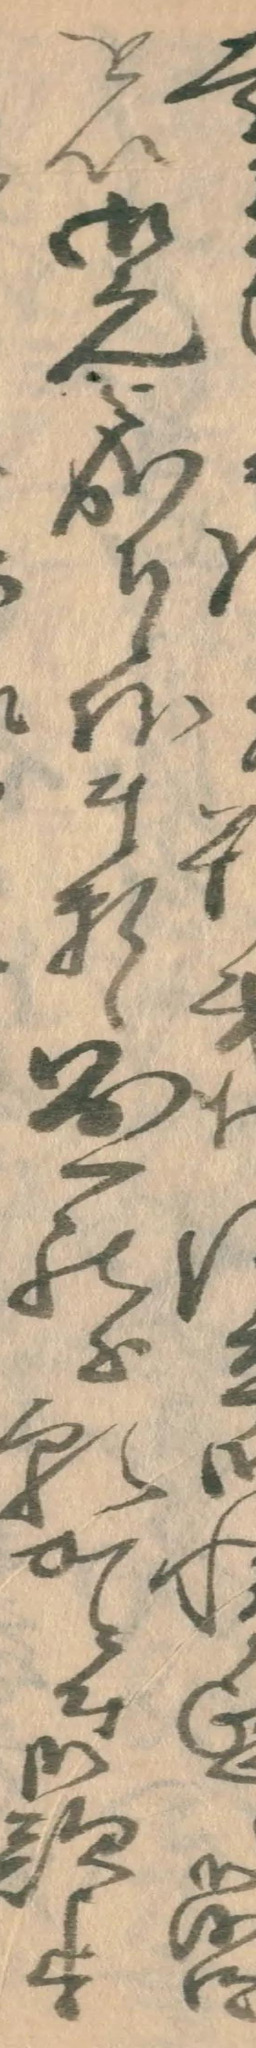を以御免被成下候様奉願候則一社迄願出候ニ付御歎申上候
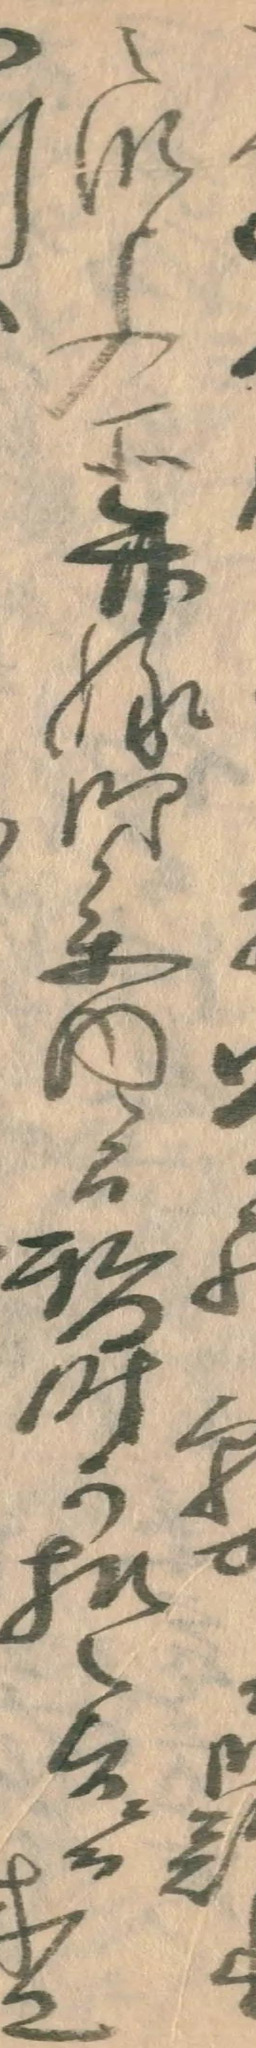之段申入所弁様御参内候間暫時可扣之旨ニ而木工
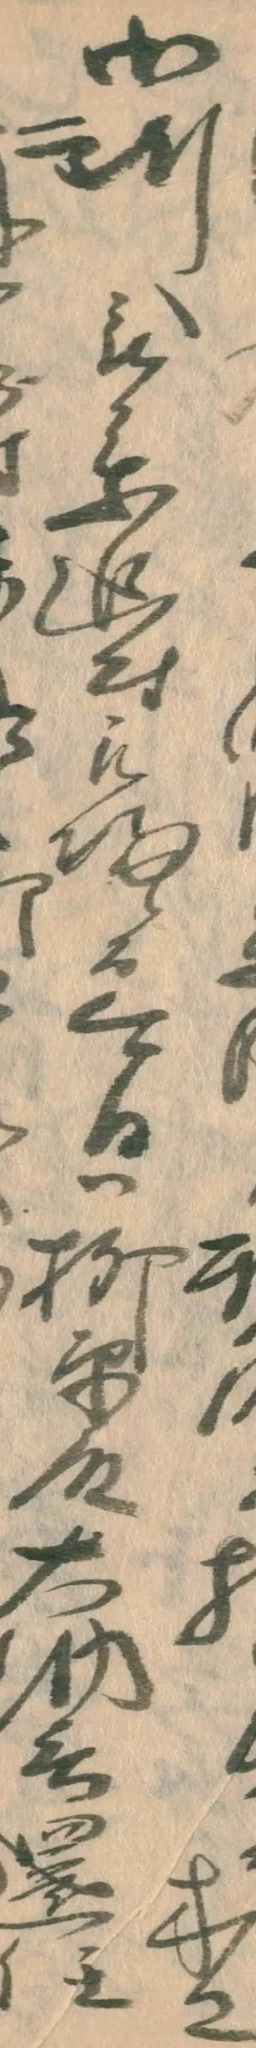御所へ被参追付被帰ニ而今日ハ御柳原殿大納言還任
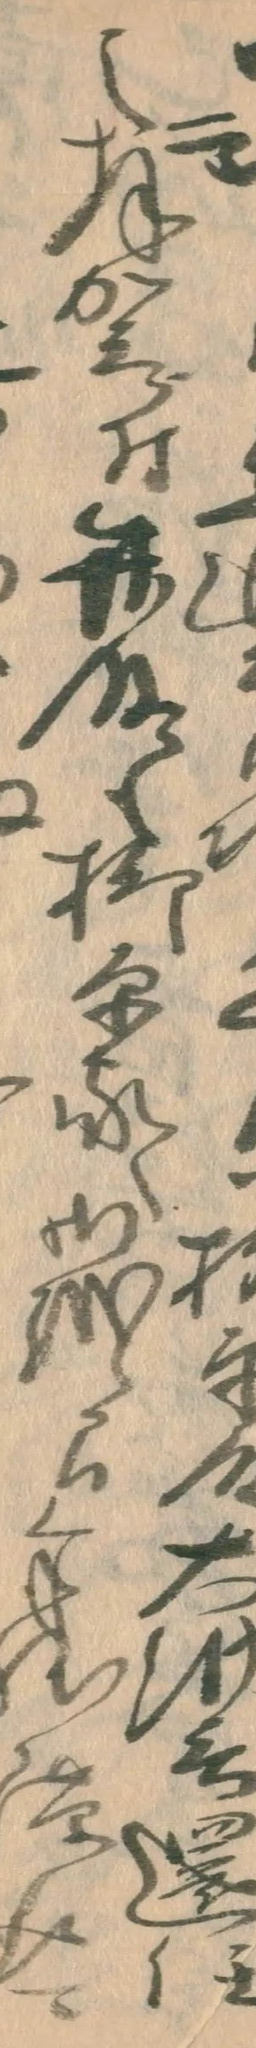之拝賀ニ付弁殿ニも柳原家へ御越候間成程隙取可
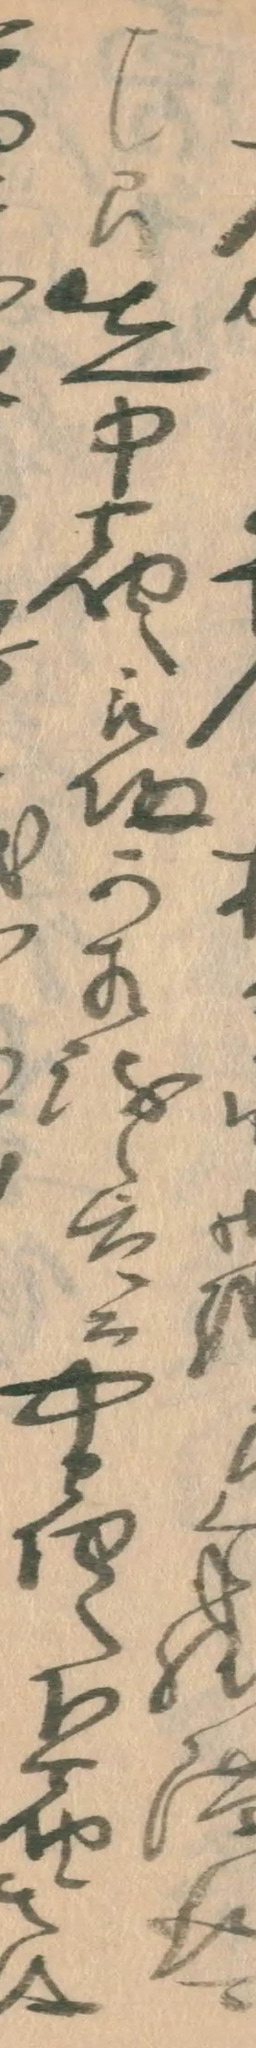申候間先中宿へ被帰可相待候旨ニ而中宿へ下宿其後
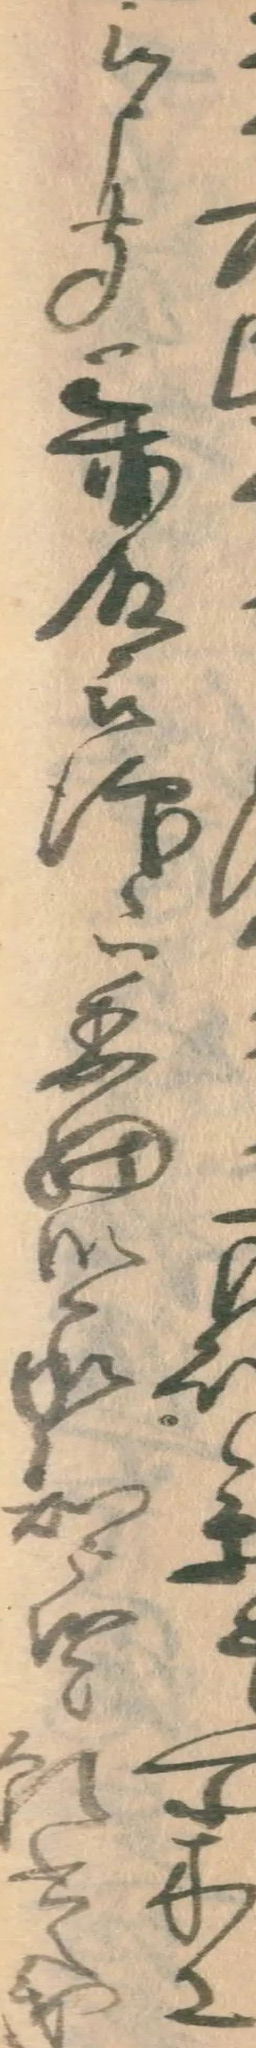被申聞ハ弁殿被仰候ハ委細御承知御座候願書之義
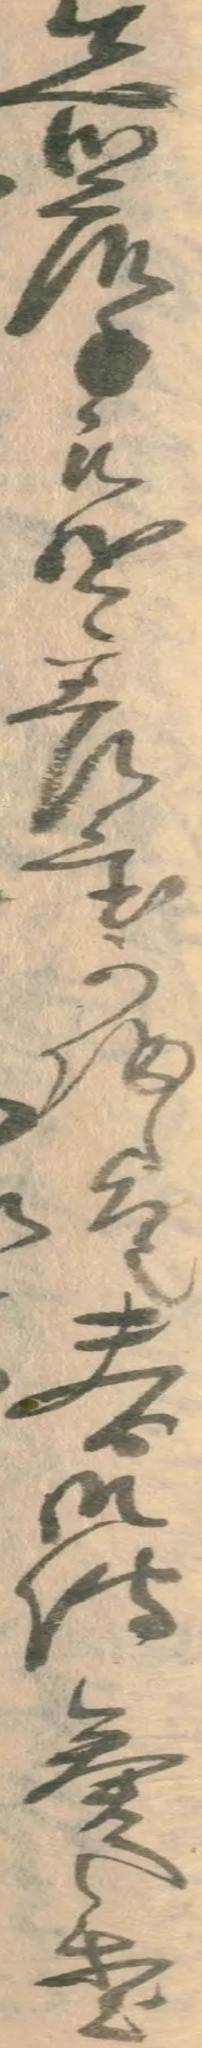先御落手被遊候差置可帰候旨也夫ゟ御伝奏者へ参上
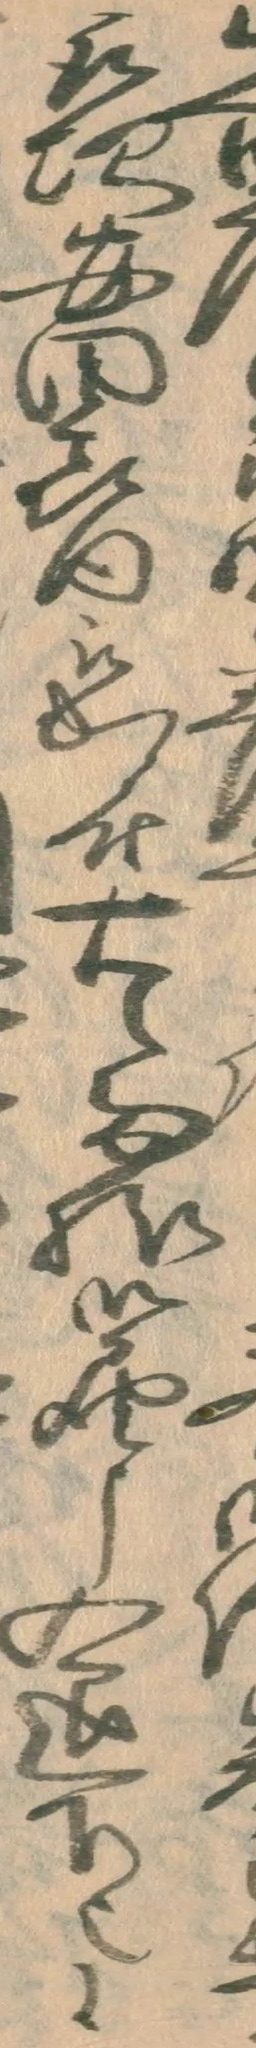取次安田喜内被出候付右之両様御届申入退下也似于
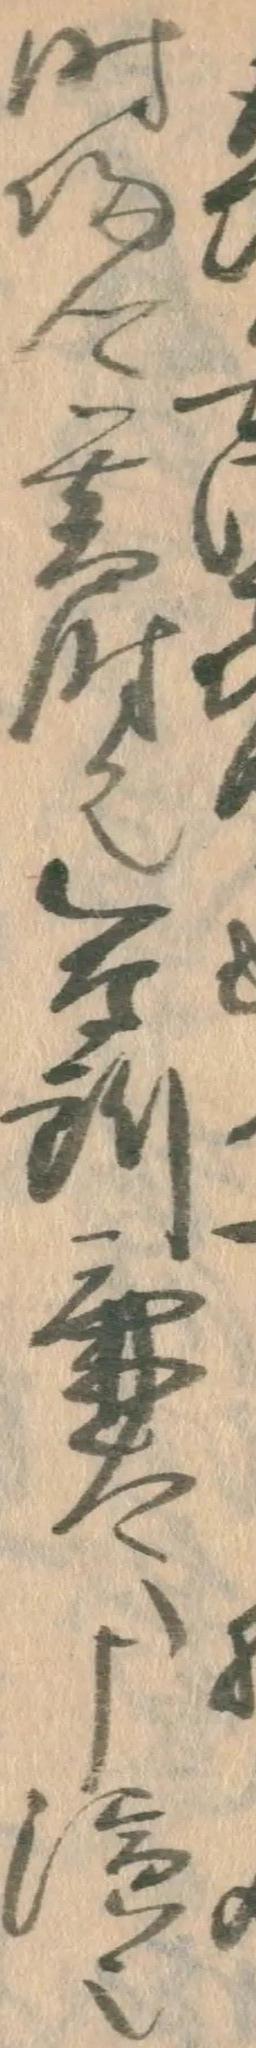時帰郷暮時也会所兼太へ申演也
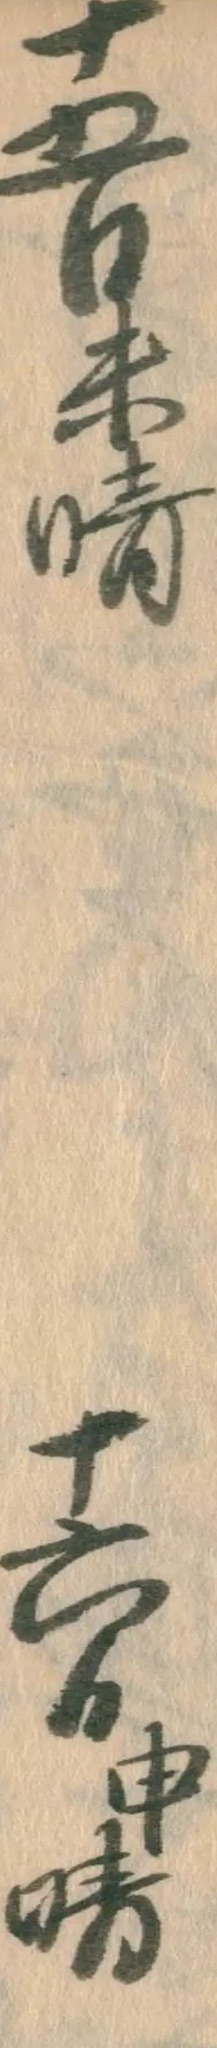十五日未晴十六日申晴
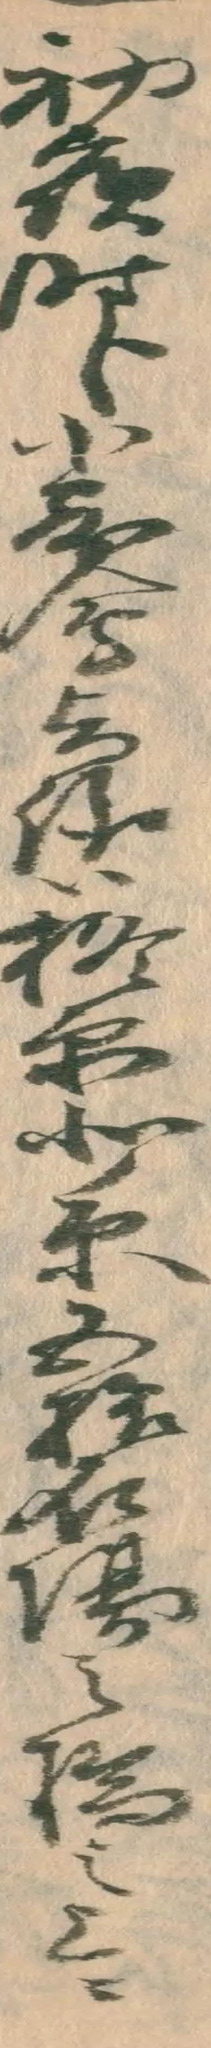一初夜時分小寄会旨趣ハ柊原北ノ原五拾石場之橋之上ニ
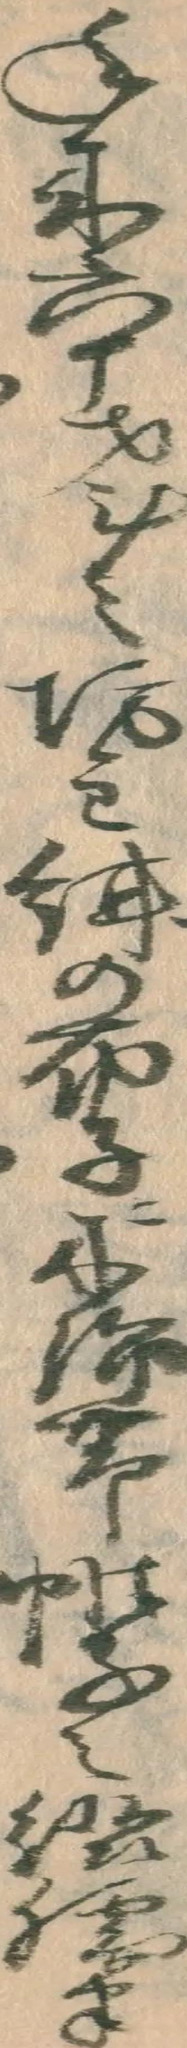年来六十才斗之坊主紺の布子ニ木綿帯帷子之綴繻半
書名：賀茂社記録. 第60冊
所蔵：国立国会図書館 National Diet Library, JAPAN
